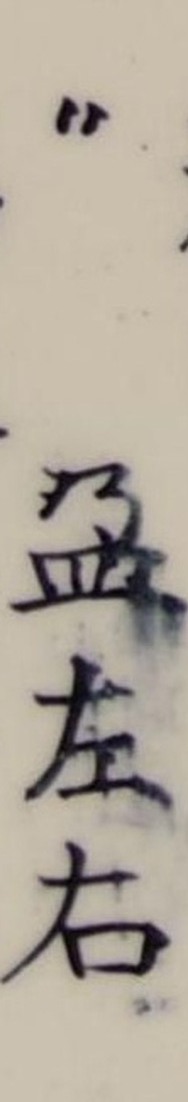盁左右
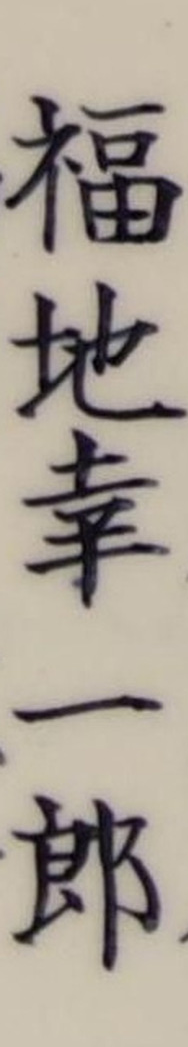福地幸一郎
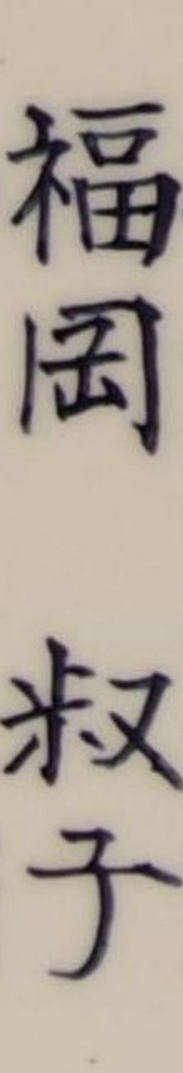福岡叔子
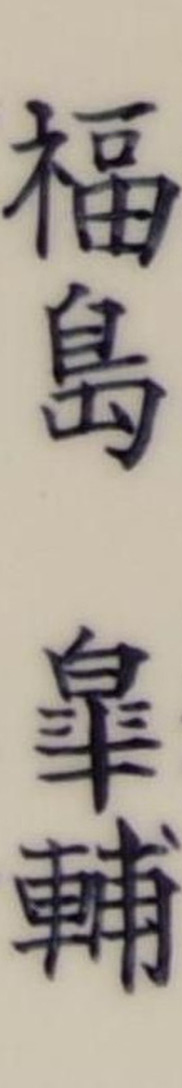福島皐輔
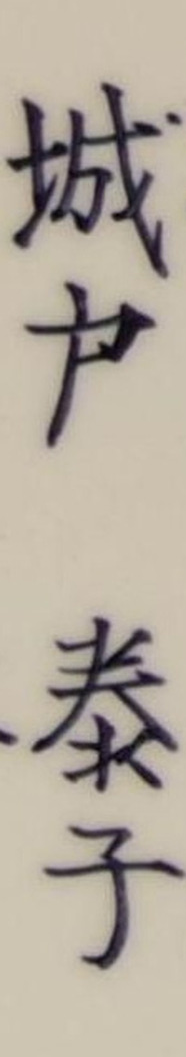城戸泰子
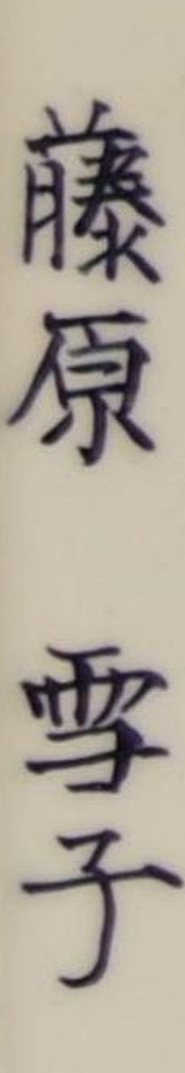藤原雪子

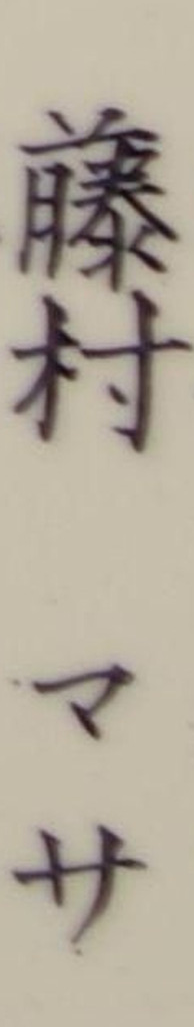藤村マサ
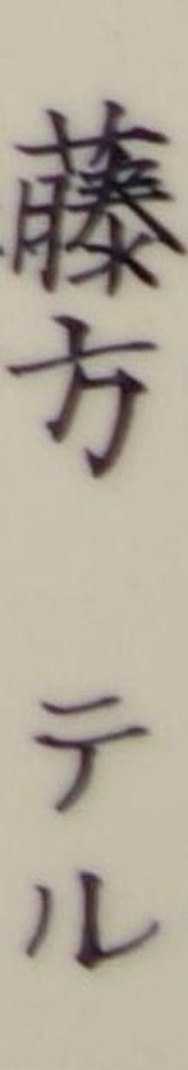藤方テル
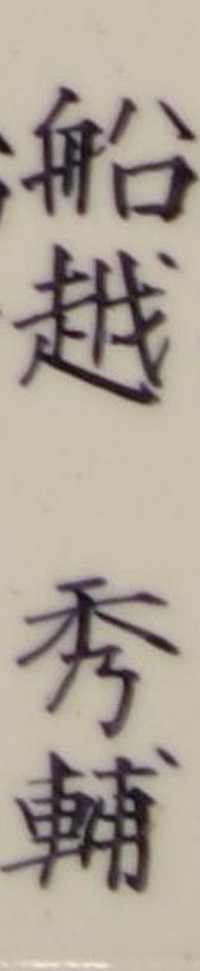船越秀輔
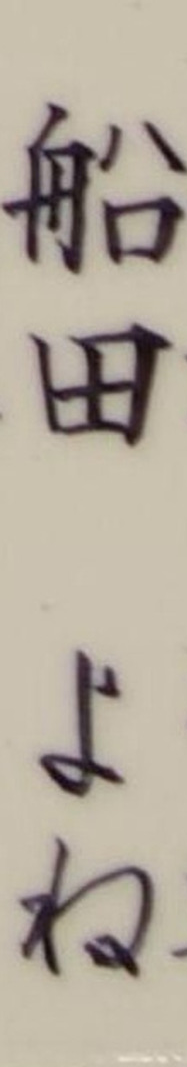船田よね
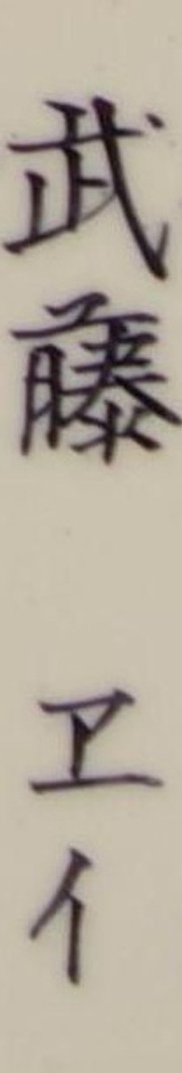武藤エイ
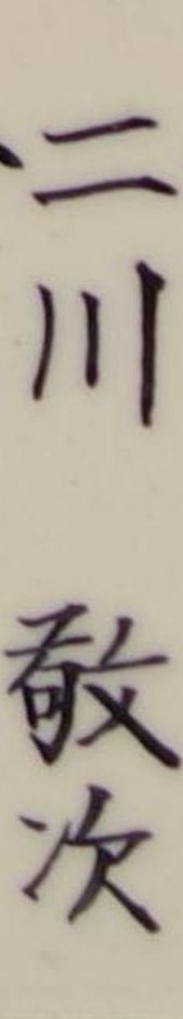二川敬次
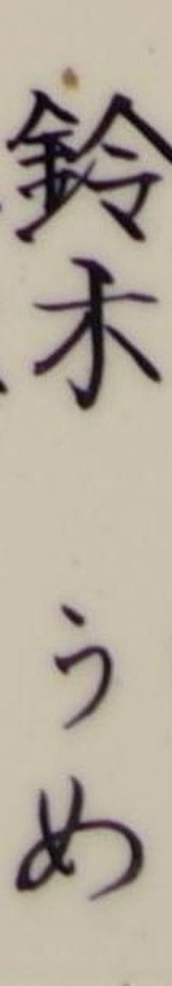鈴木うめ
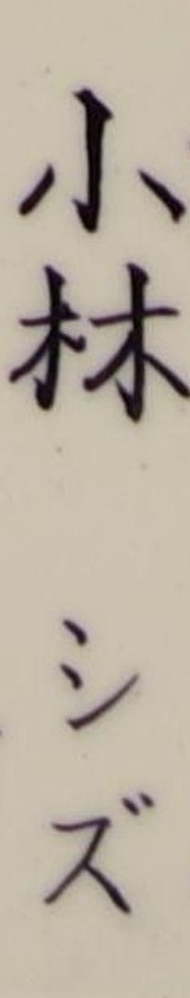小林シズ
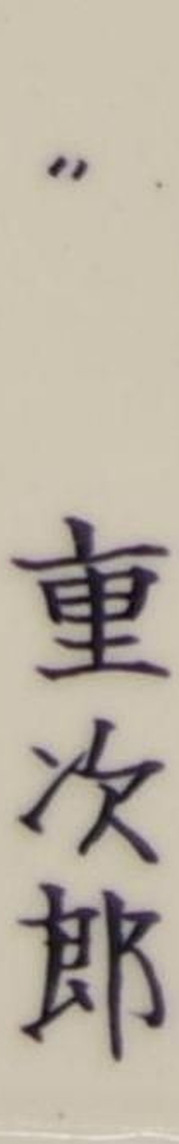重次郎
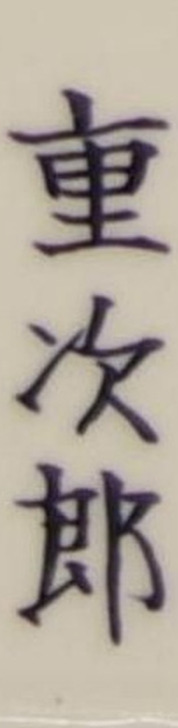重次郎
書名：E~L
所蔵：高野山金剛峯寺
